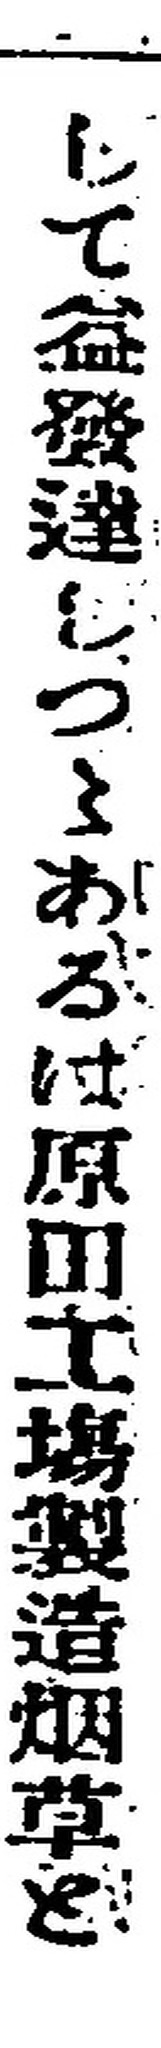して益発達しつゝあるは原田工場製造烟草と
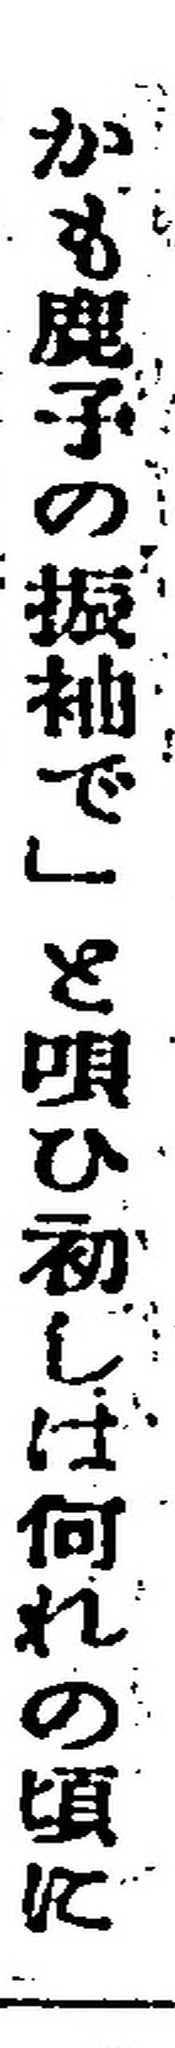かも鹿子の振袖で」と唄ひ初しは何れの頃に
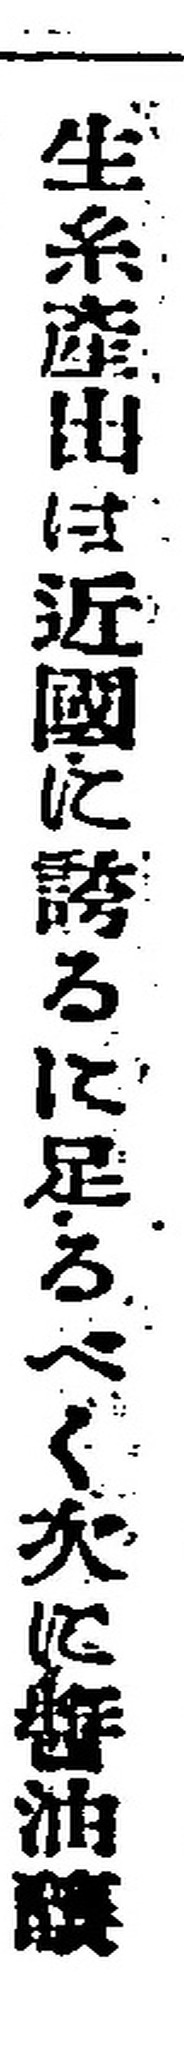生糸産出は近国に誇るに足るべく次に醤油醸
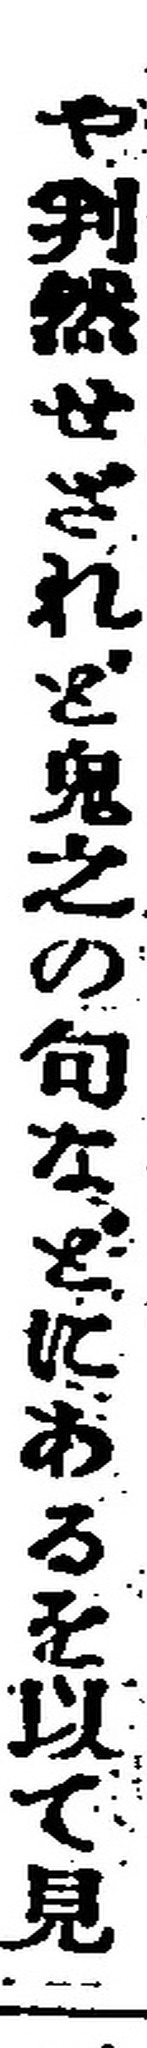や判然せざれど鬼之の句などにあるを以て見
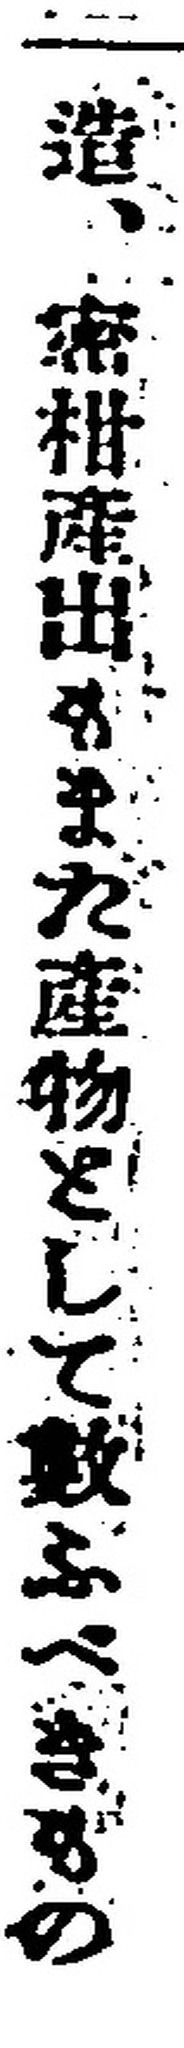造、蜜柑産出もまた産物として数ふべきもの
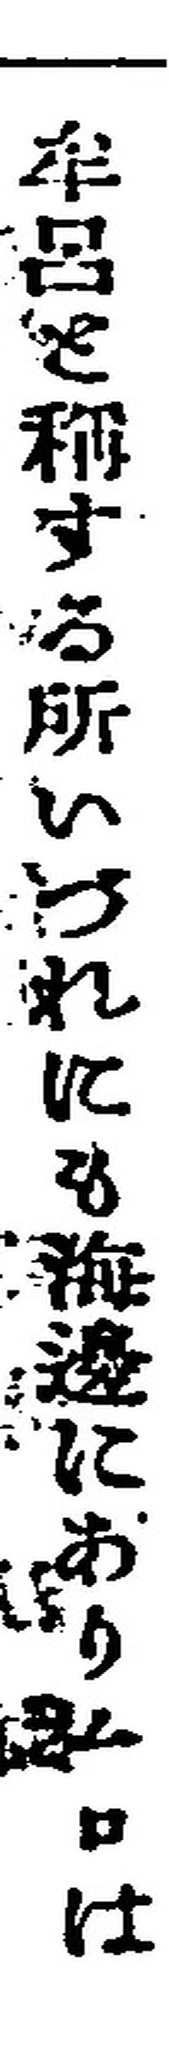牟呂を称する所いづれにも海辺にありムロは
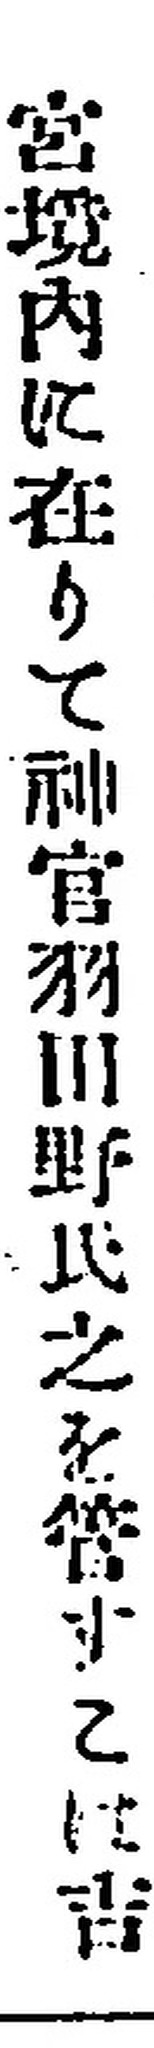宮境内に在りて神官羽田野氏之を管すこは吉
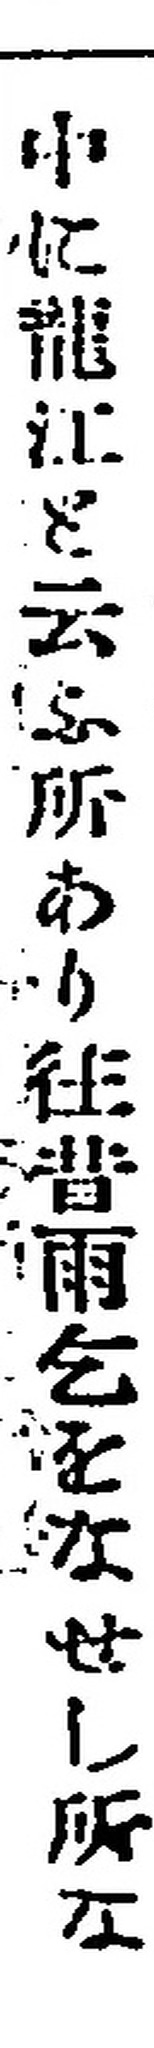中に龍江と云ふ所あり往昔雨乞をなせし所な
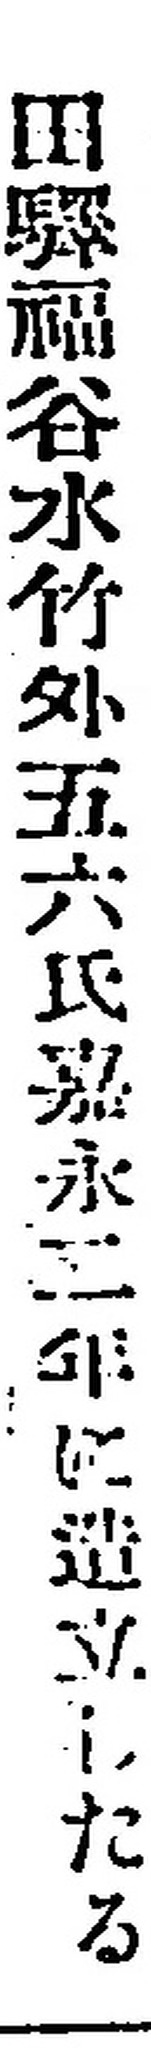田駅福谷水竹外五六氏嘉永二年に造立したる
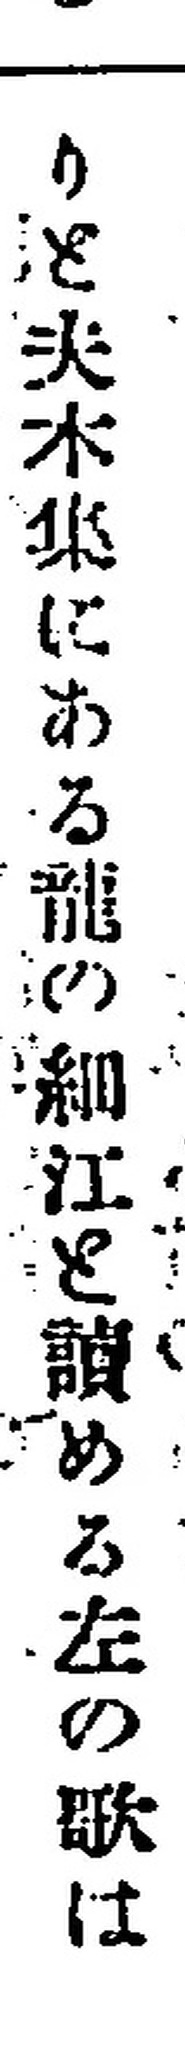りと夫木集にある龍の細江と読める左の歌は
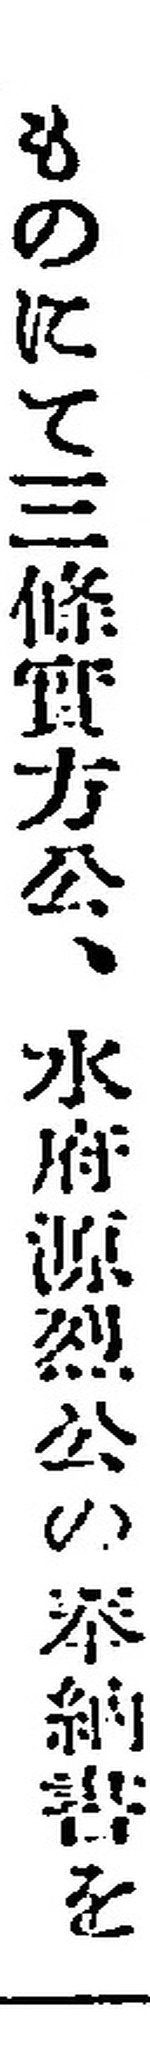ものにて三条実方公、水府源烈公の奉納書を
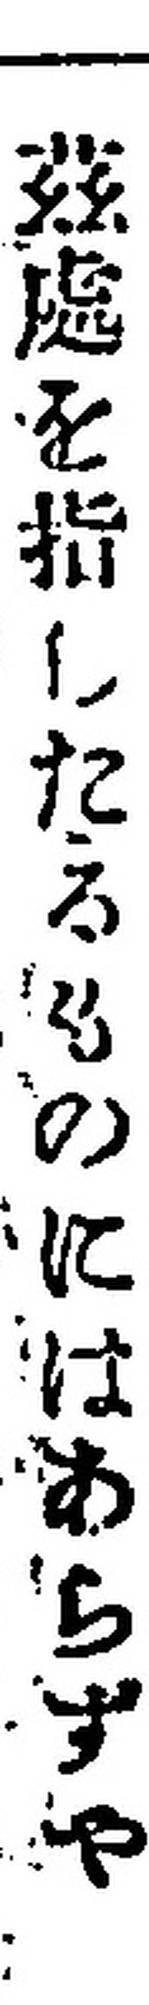茲処を指したるものにはあらずや
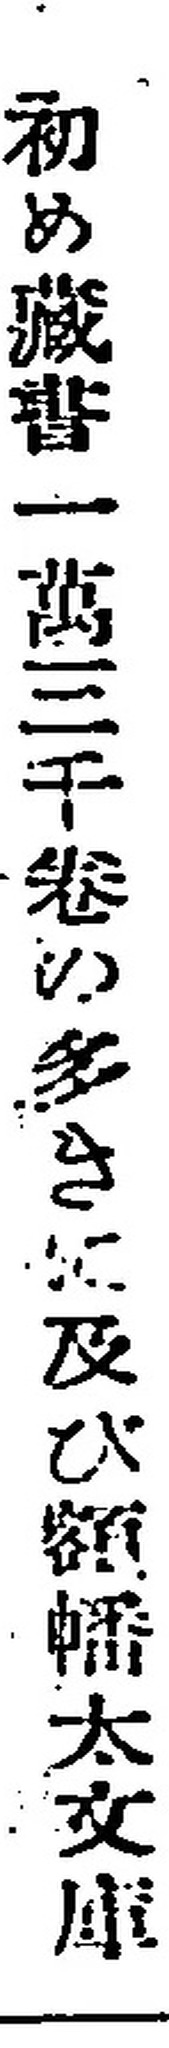初め蔵書一万三千巻の多きに及び額幡太文庫
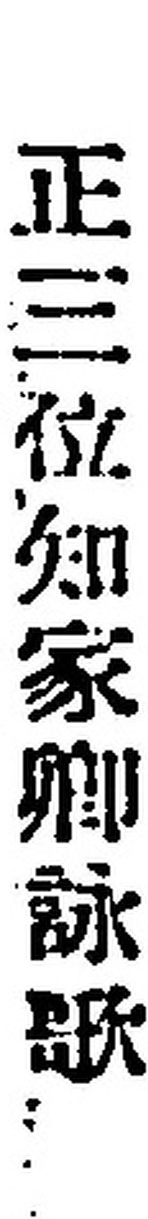正三位知家卿詠歌
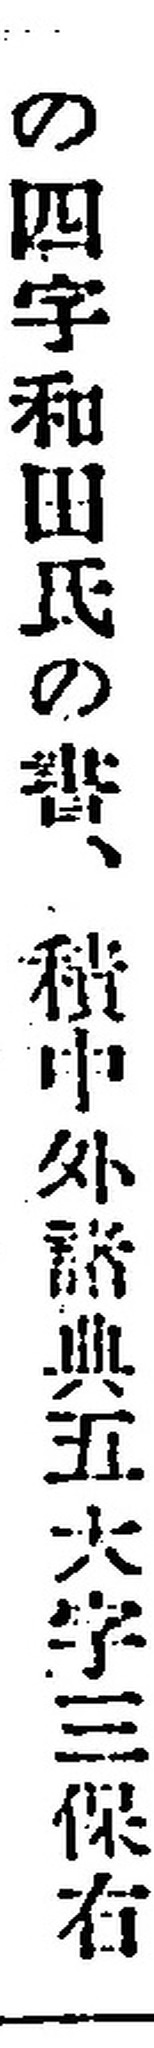の四字和田氏の書、積中外諸典五大字三保右
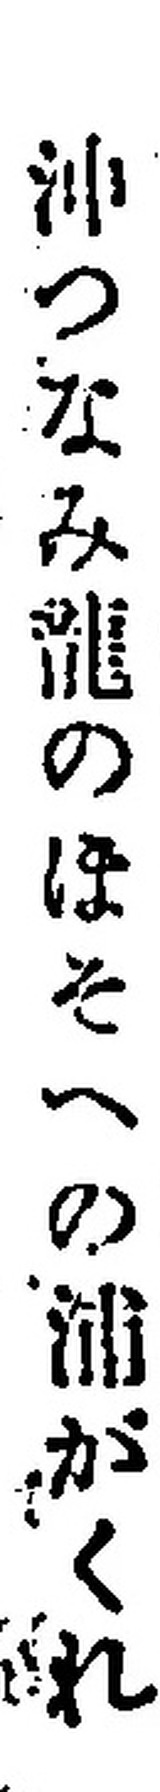沖つなみ龍のほそへの浦がくれ
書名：東参名勝案内
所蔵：国立国会図書館 National Diet Library, JAPAN
